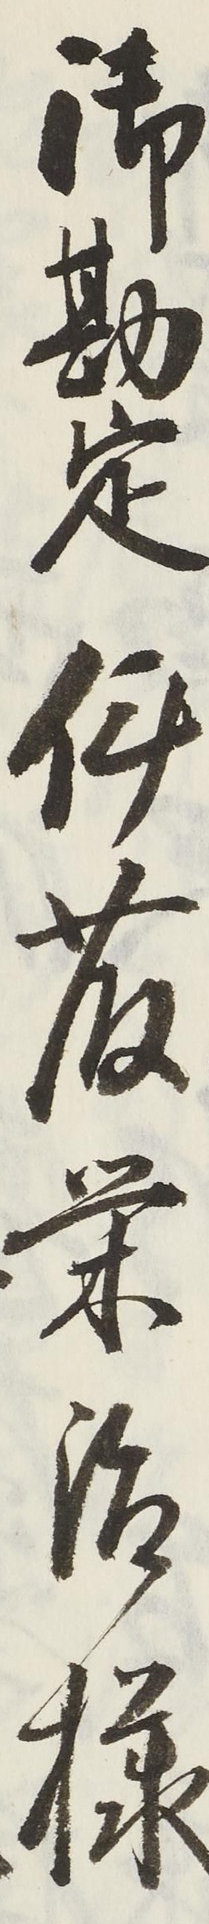御勘定伊藤栄治様
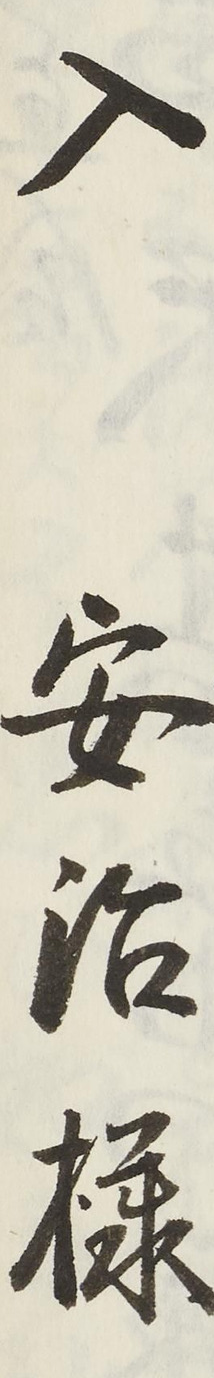入安治様

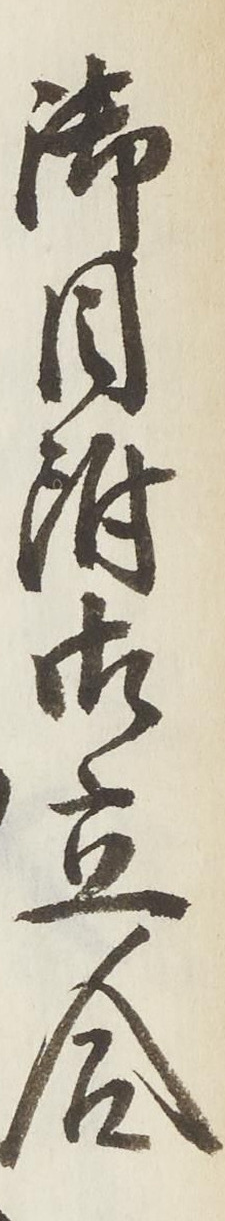御目付御立合
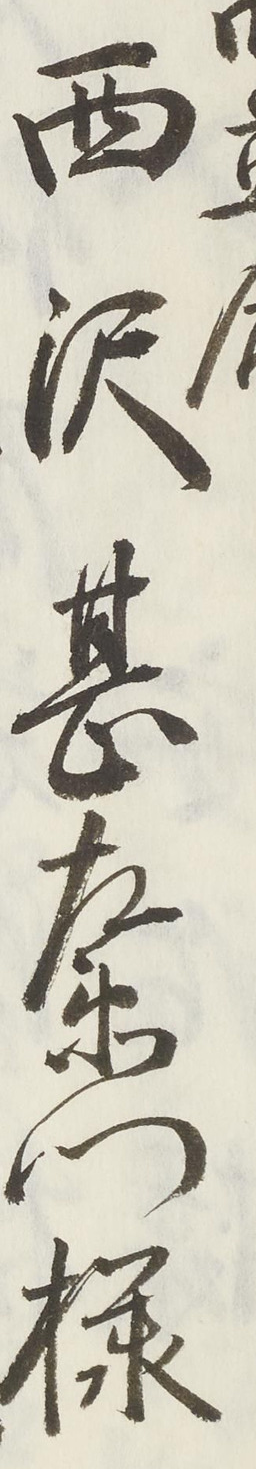西沢甚左衛門様
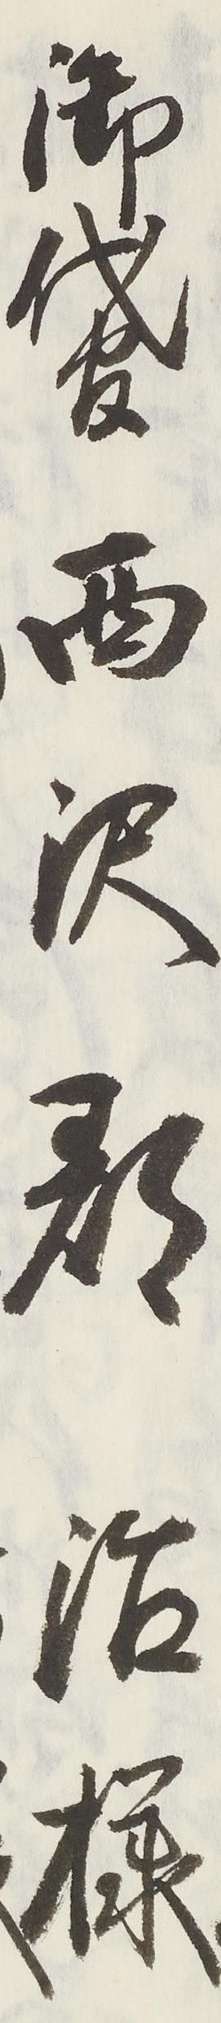御代官西沢郡治様
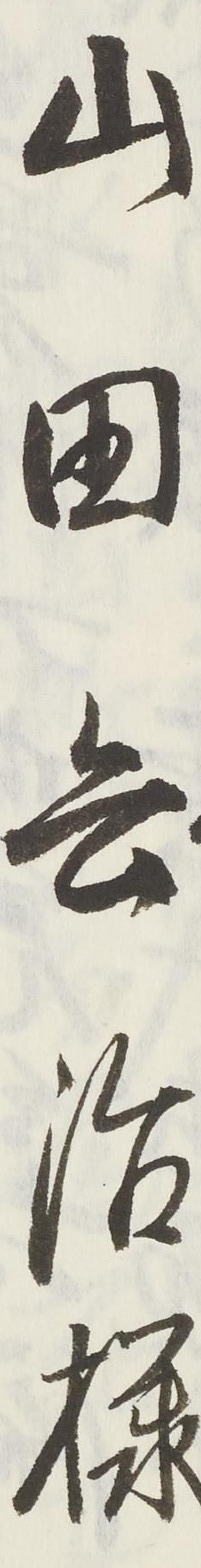山田兵治様
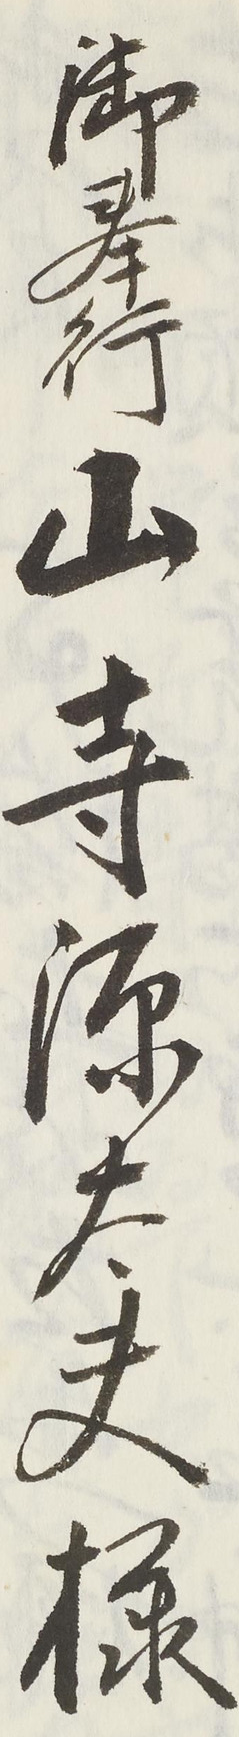御奉行山寺源太夫様
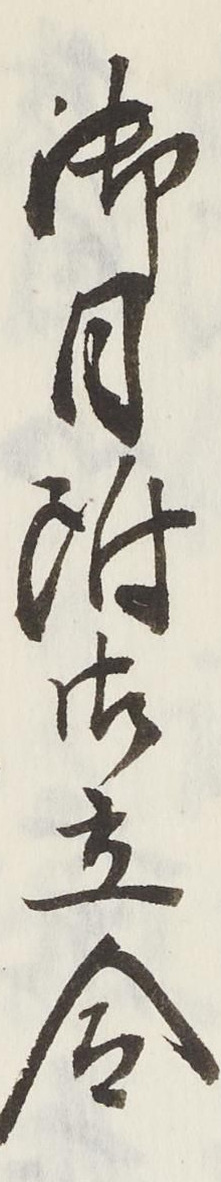御目付御立合
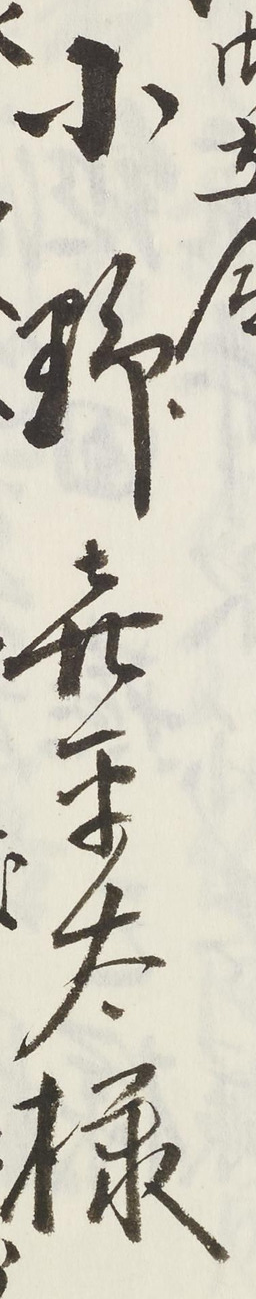小野喜平太様
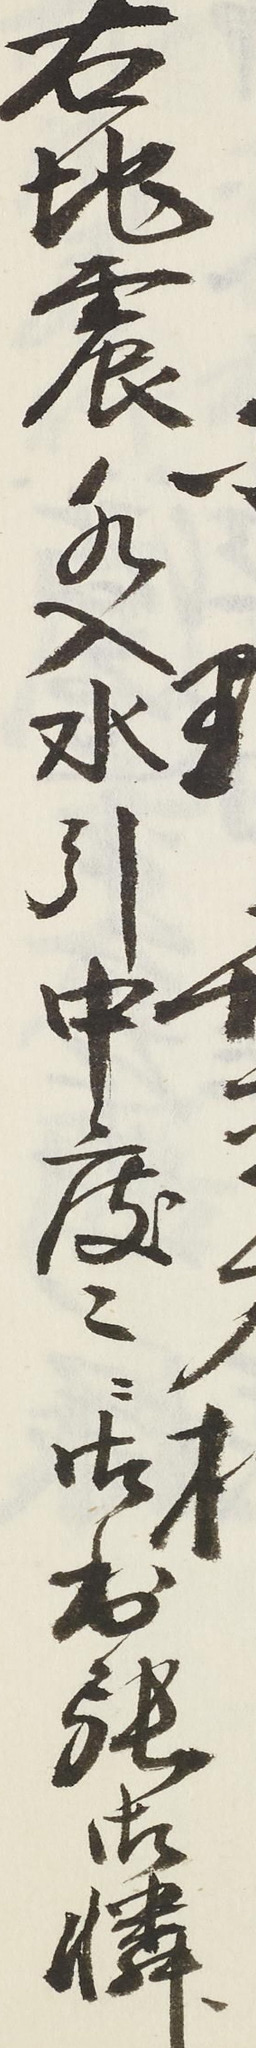右地震水入水引中度々ニ御出張御憐
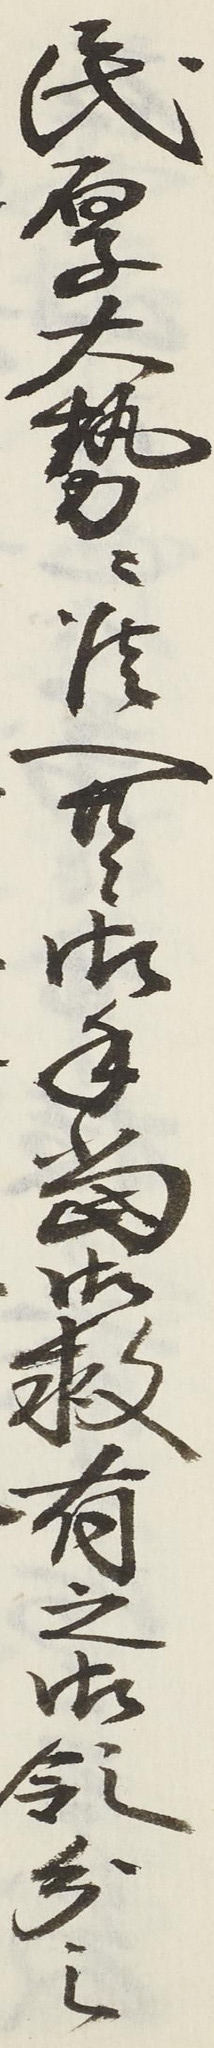民厚大勢二候へ共御手当御救有之御領分之
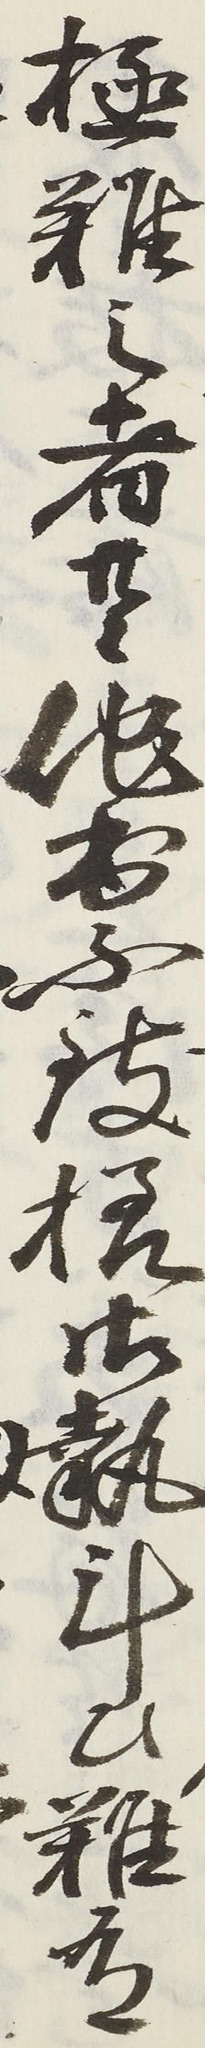極難之者共他出不致様御執斗ひ難有
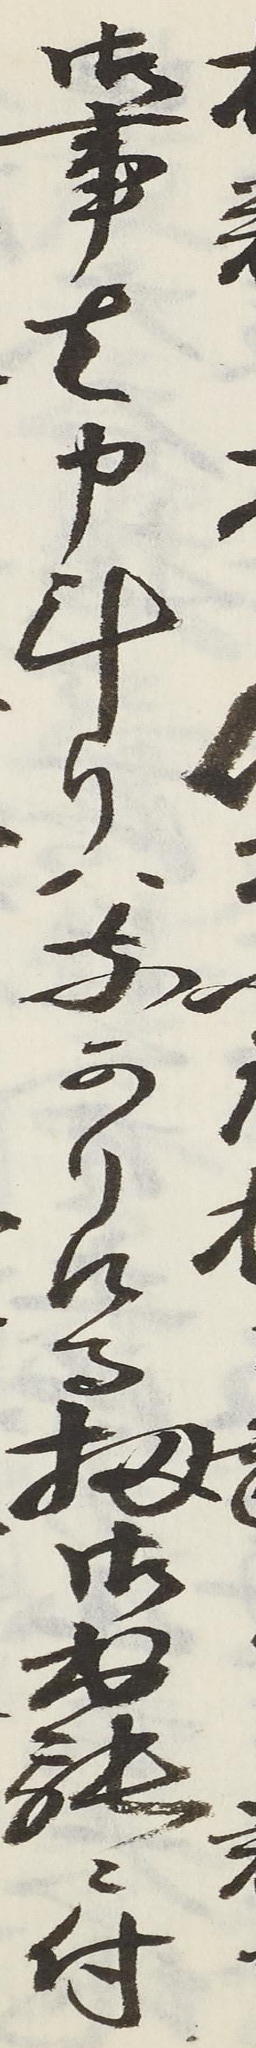御事は申斗りはなかりける扨御出張二付
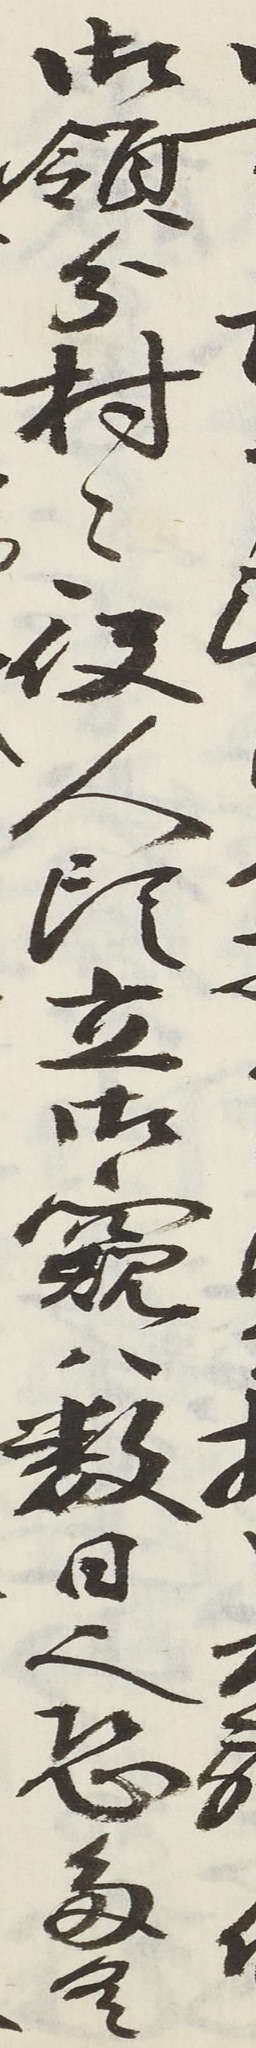御領分村々役人頭立御窺ハ数日也恐多く
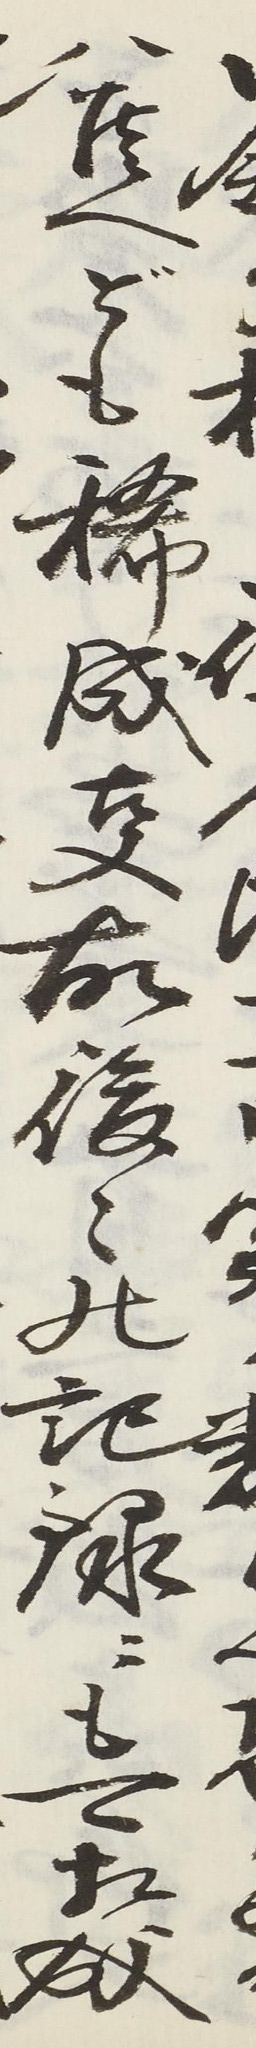ハ候へども稀成事故後々の記録二も可相成
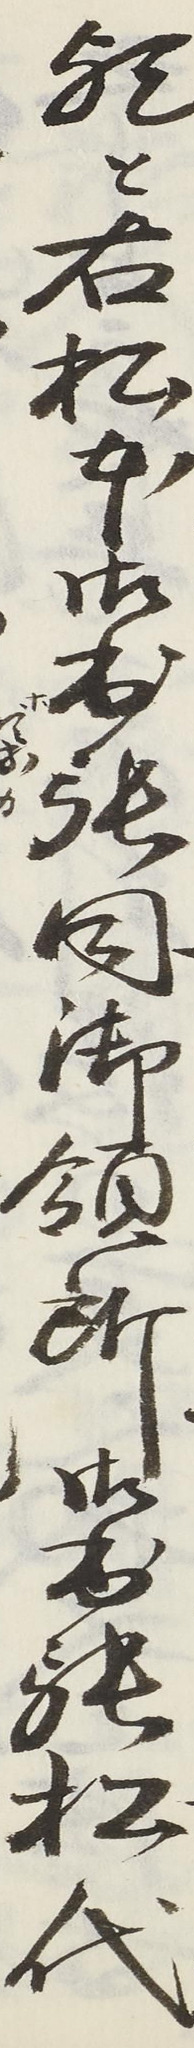歟と右松本御出張同御領所御出張松代
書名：弘化四年地震記
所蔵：東京大学地震研究所図書室 Earthquake Research Institute Library, The University of Tokyo, JAPAN
